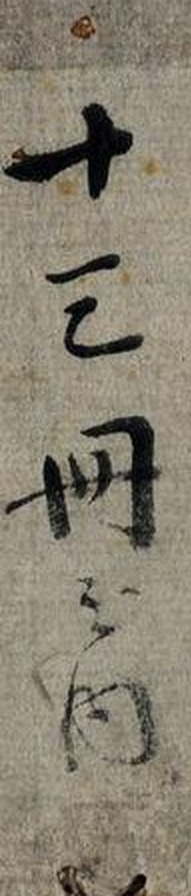十三冊之内

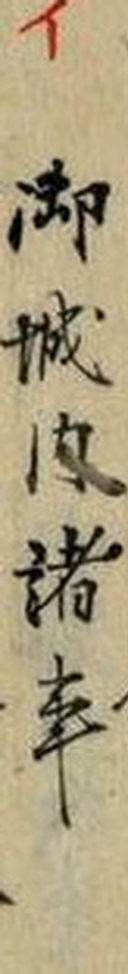イ御城内諸事
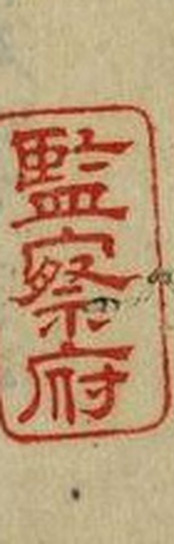監察府
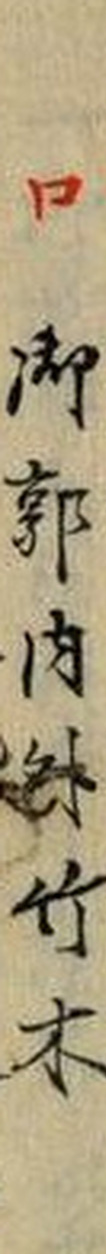ロ御郭内外竹木
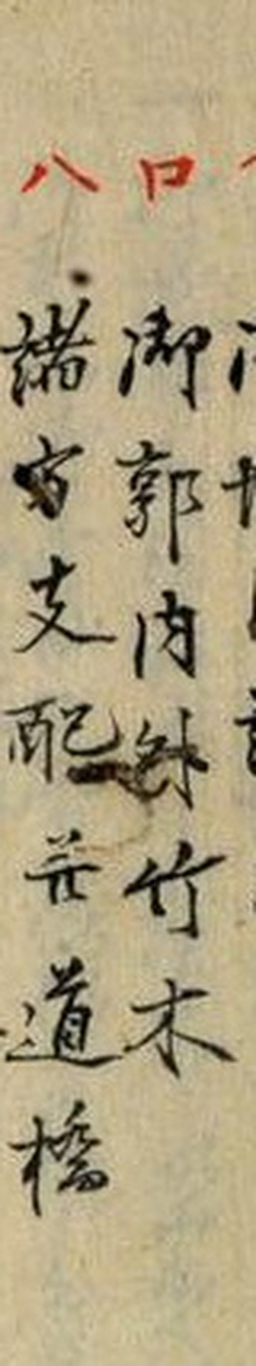ハ諸方支配并道橋
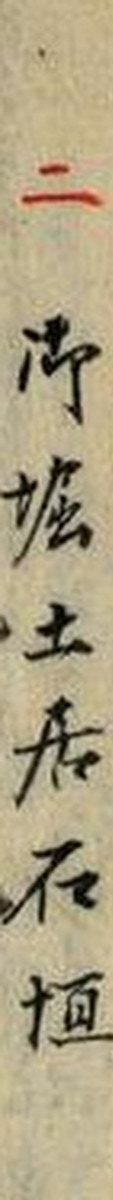ニ御堀土居石垣
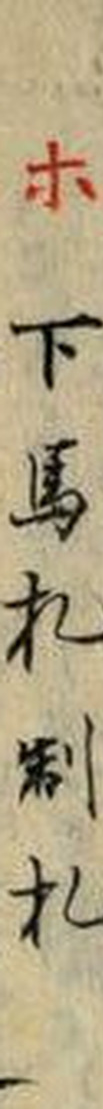ホ下馬礼制札
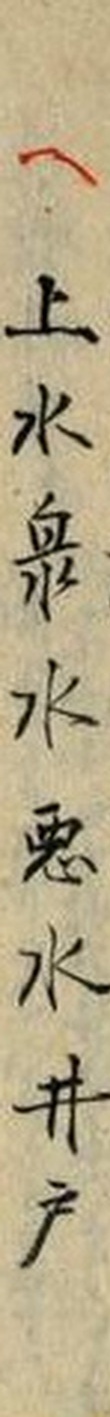ヘ上水泉水悪水井戸
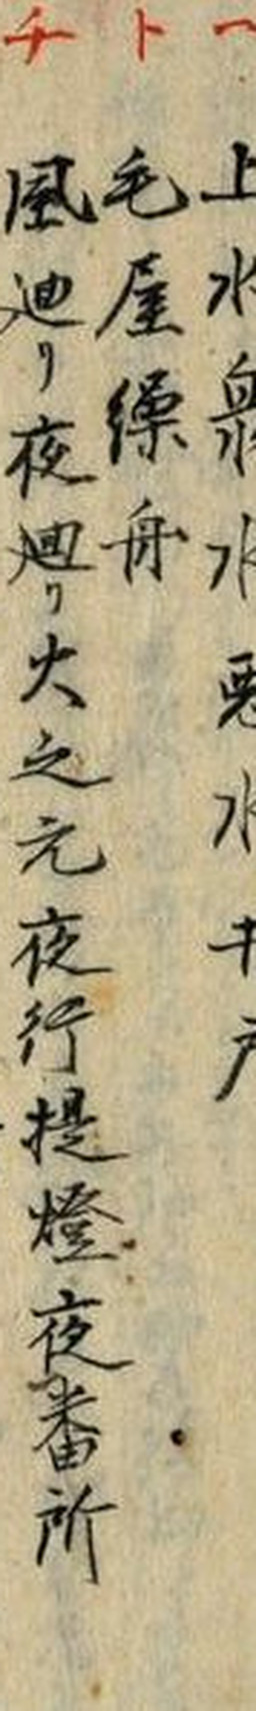チ風廻リ夜廻リ火之元夜行提燈夜番所
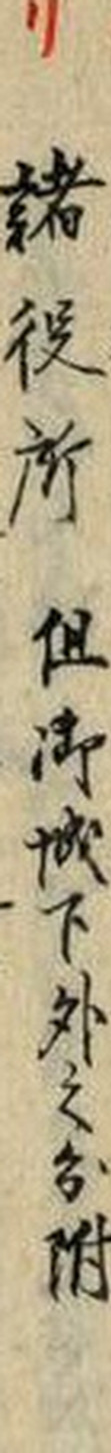リ諸役所但御城下外之分附
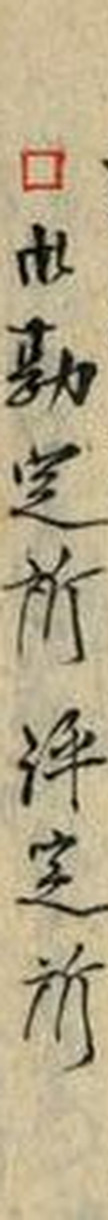御勘定所評定所
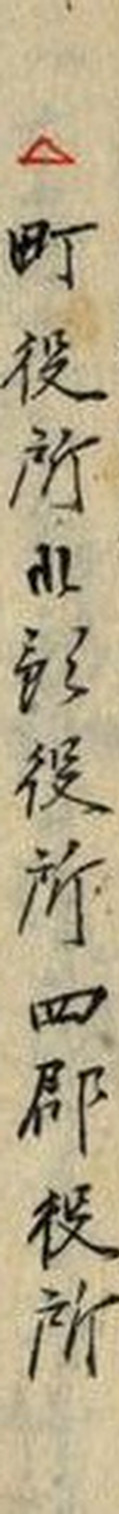△町役所御預役所四郡役所
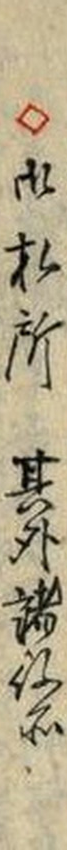◇御札所其外諸役所
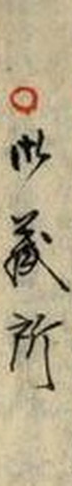○御蔵所
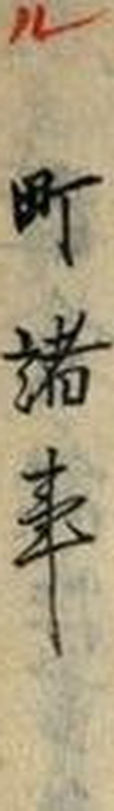ル町諸事

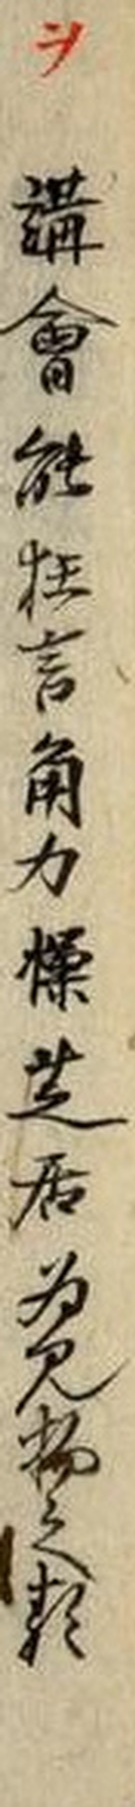ヲ講会能狂言角力操芝居為見物之類
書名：御城下諸事之部
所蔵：福井県文書館 Fukui Prefectural Archives
